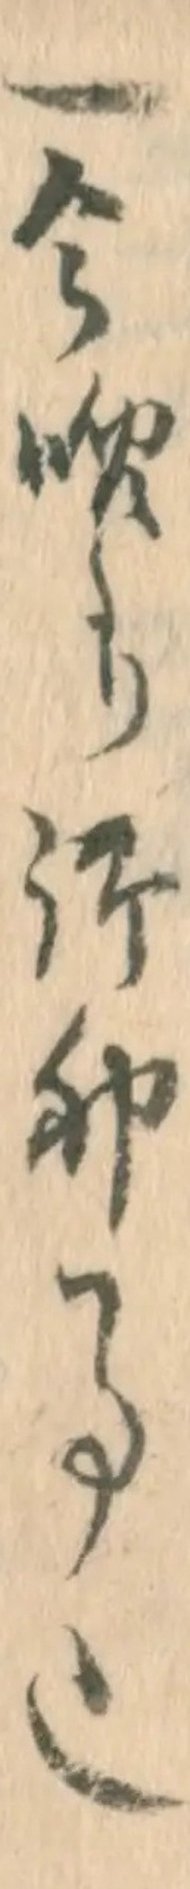一今晩より御神事也
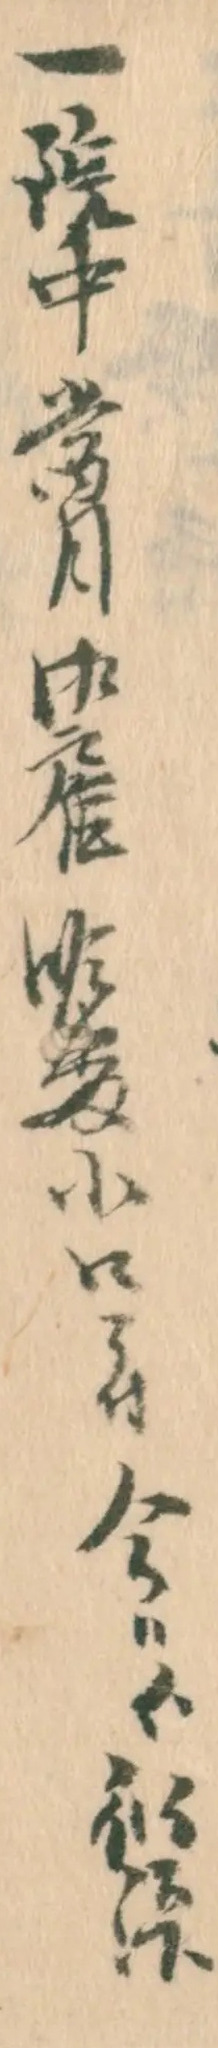一院中当月御雇順番小口ニ付今日ゟ彼御所
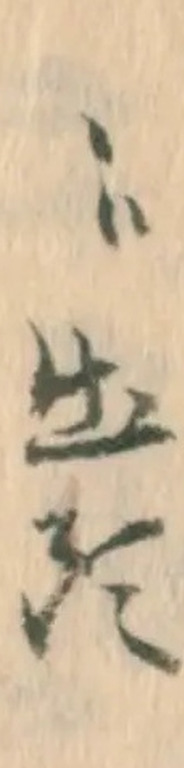え出頭
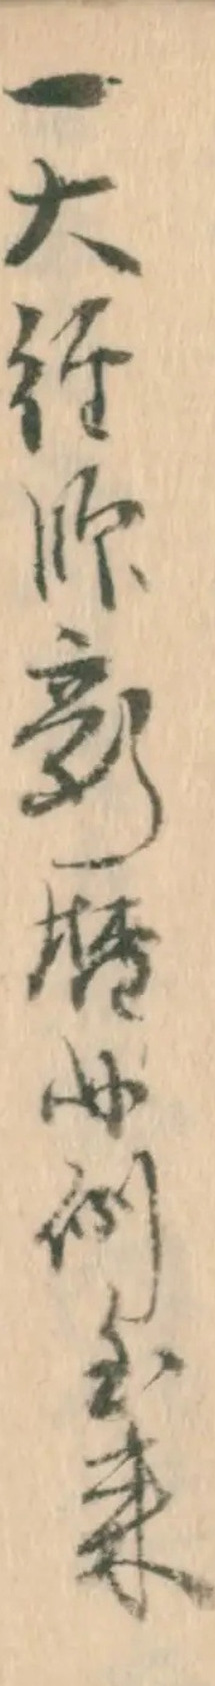一大経師新暦如例到来
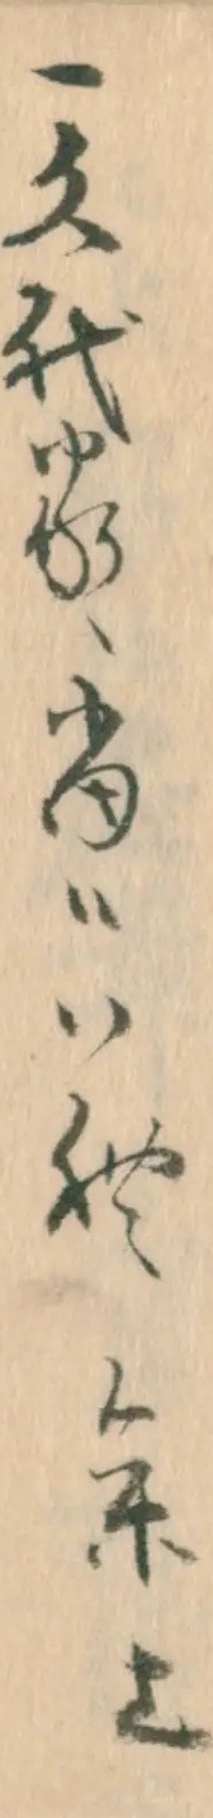一久我家へ当日御礼参上
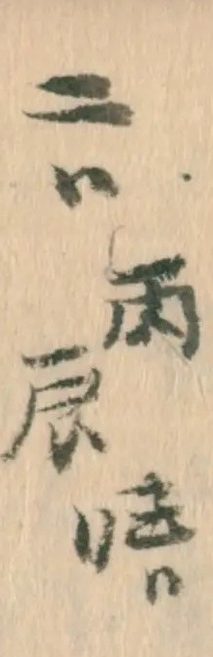二日丙辰晴
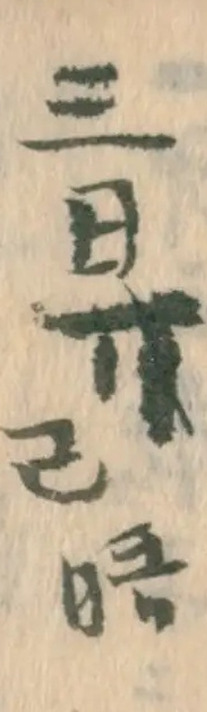三日丁巳晴
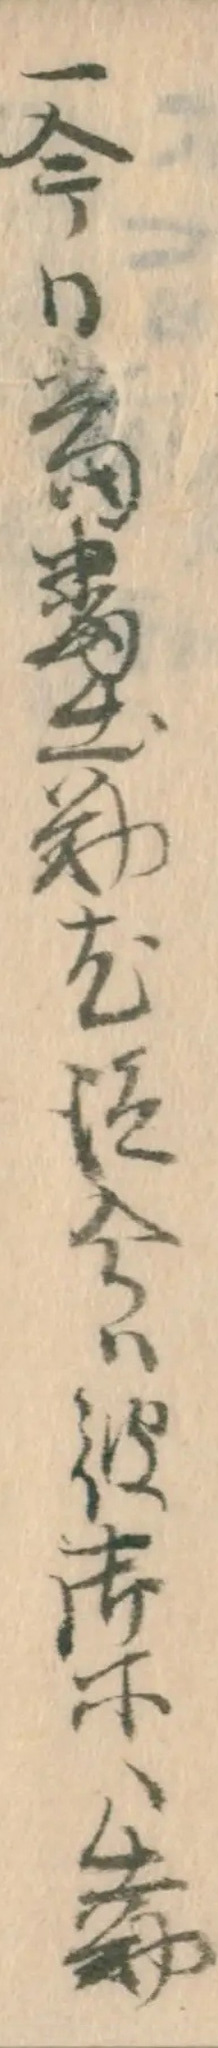一今日当番出勤尤従今日彼御所へ出勤
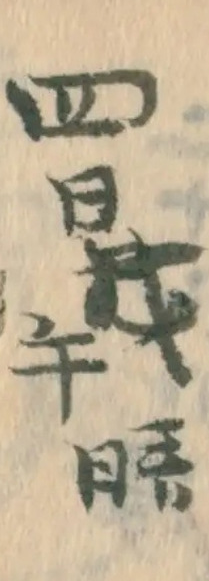四日戊午晴
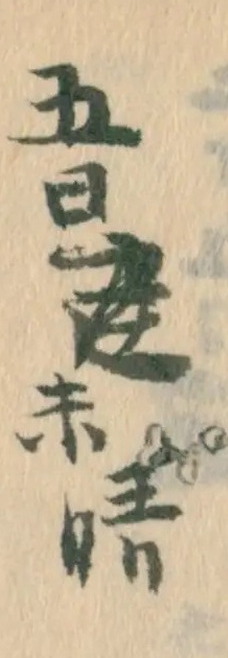五日己未晴

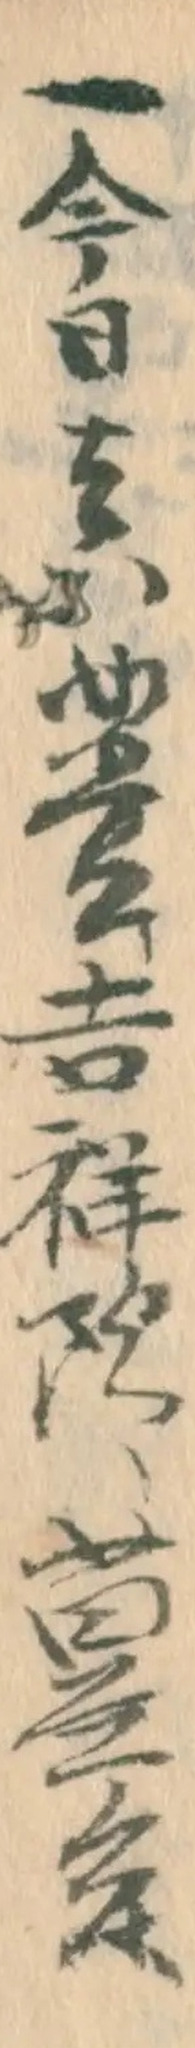一今日真如堂吉祥院へ墓参
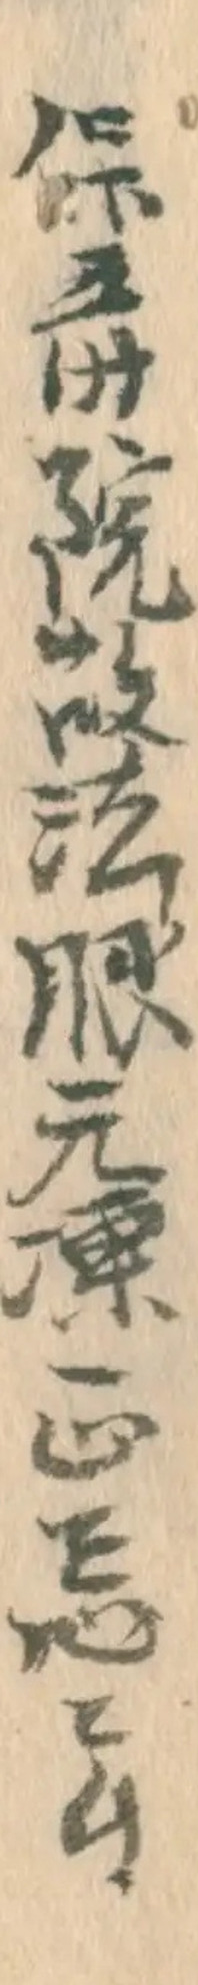保寿院故法眼元凍正忌ニ付
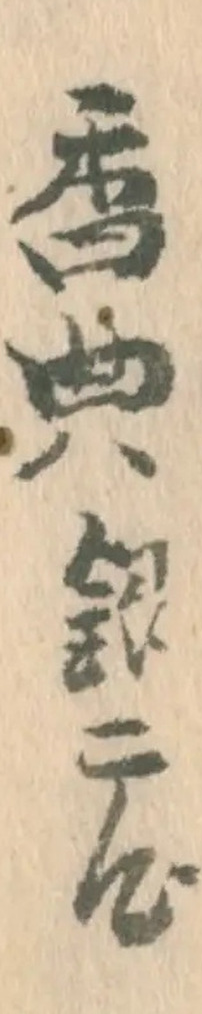香典銀二匁
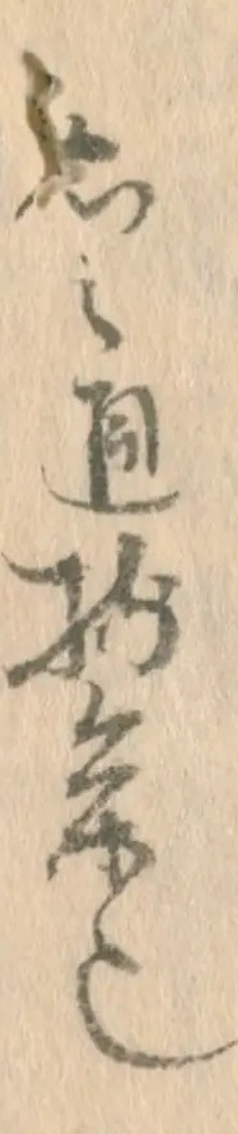右之通持参也
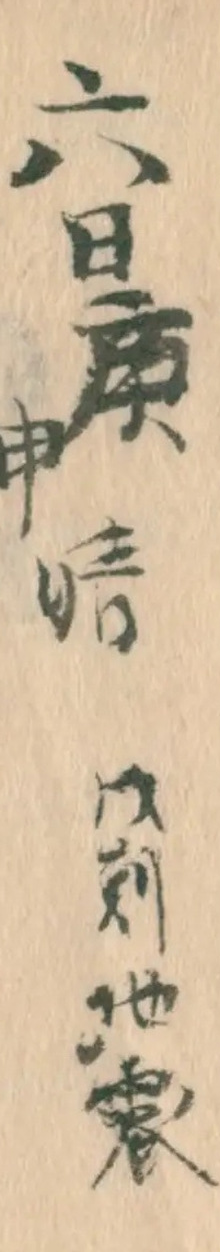六日庚申晴戌刻地震
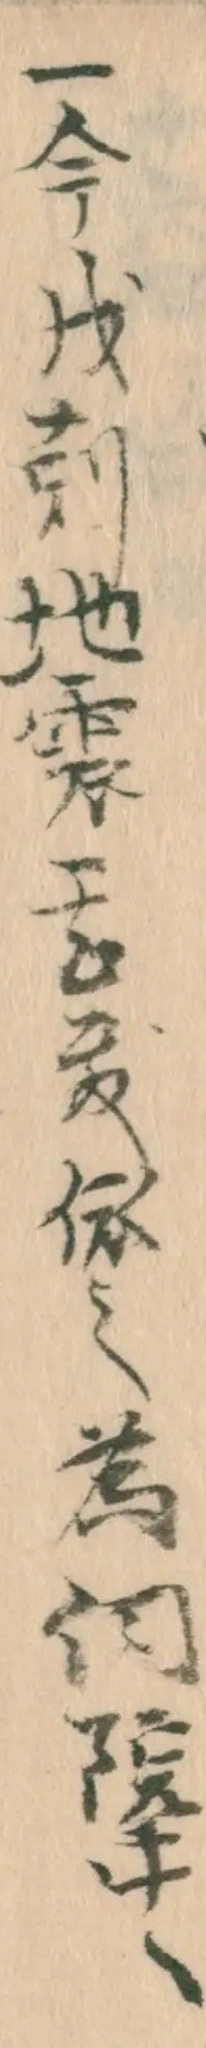一今戌刻地震甚敷依之為伺院中へ
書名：禁裏御所御用日記. [131]
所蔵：国立国会図書館 National Diet Library, JAPAN
